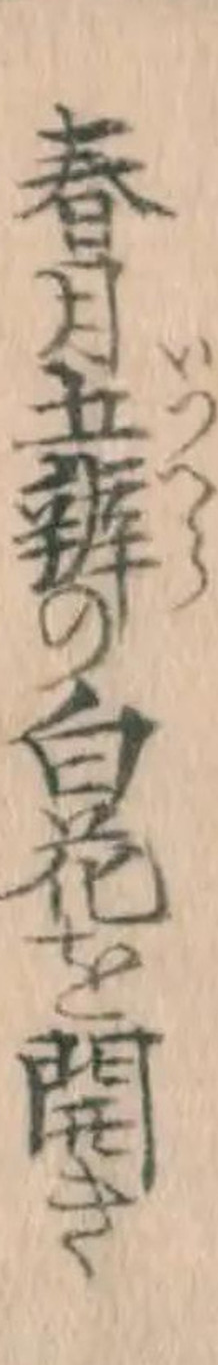春月五弁の白花を開き
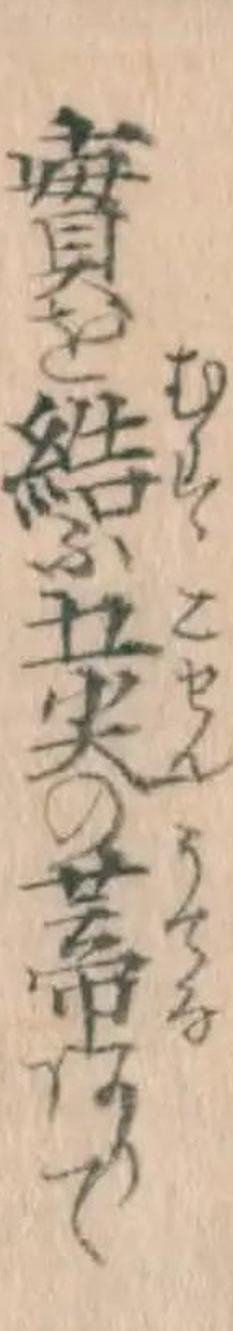実を結ふ五尖の蒂ありて
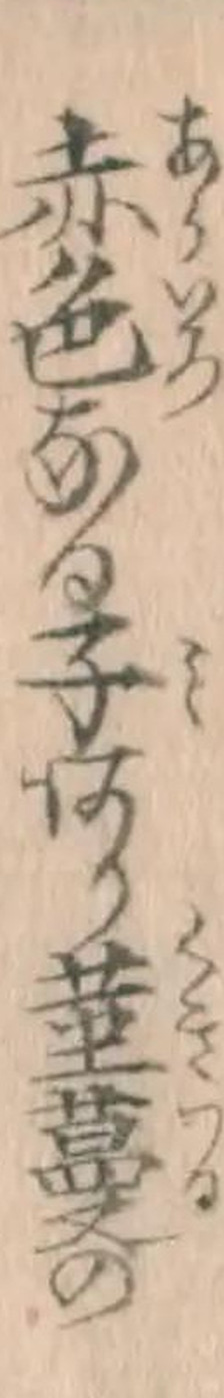赤色なる子あり茎蔓の
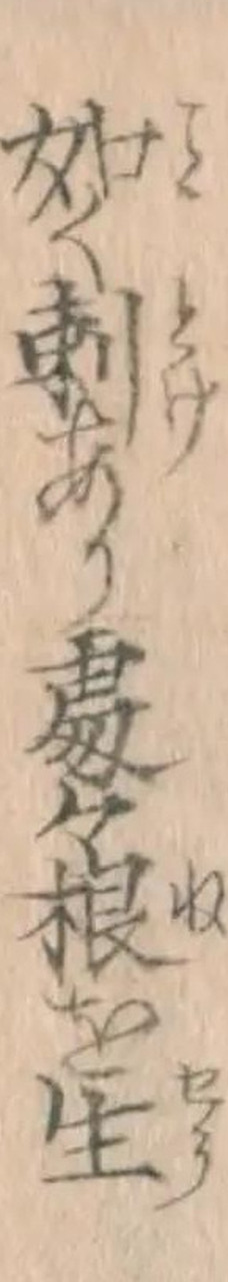如く剌あり処々根を生
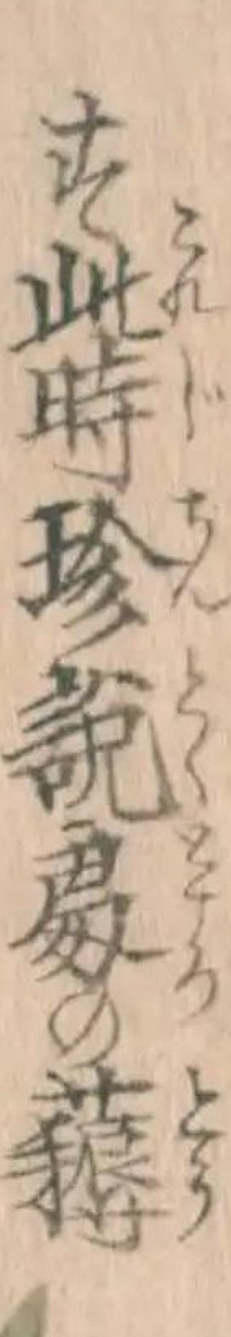す此時珍説処の𧂭
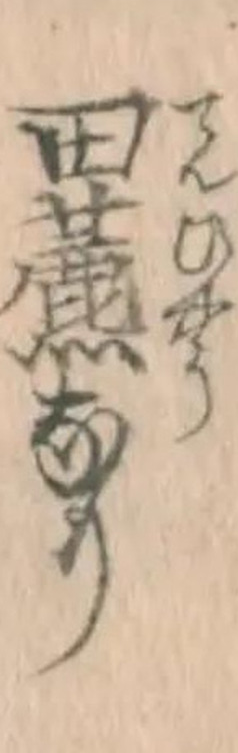田藨なり

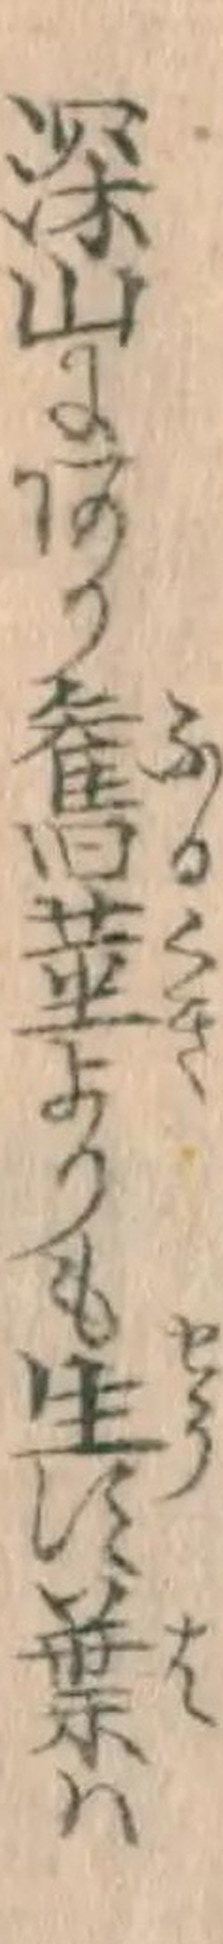深山にあり旧茎よりも生す葉は
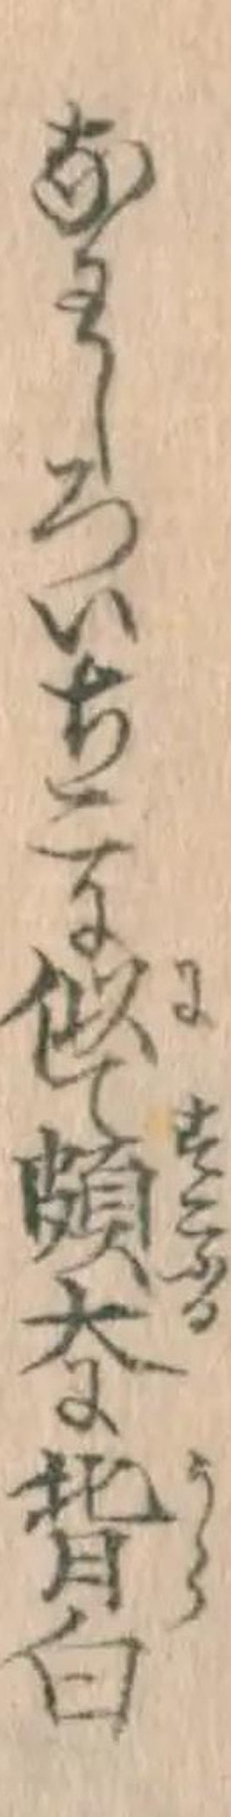なわしろいちこに似て頗大に背白
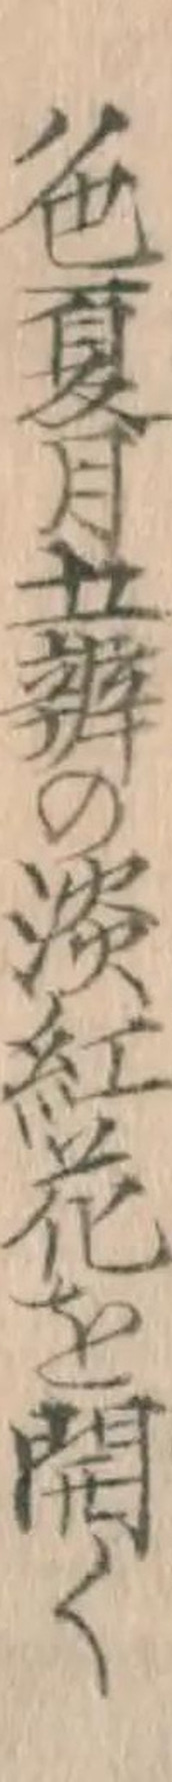色夏月五弁の淡紅花を開く
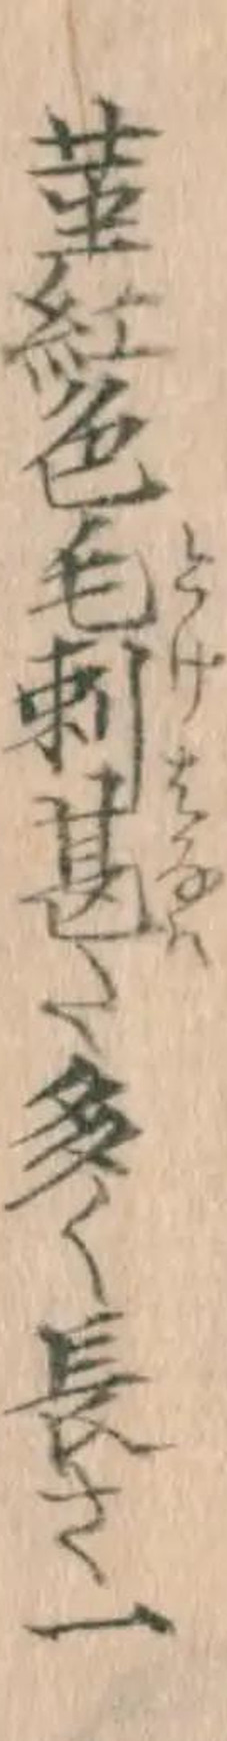茎紅色毛剌甚た多く長さ一
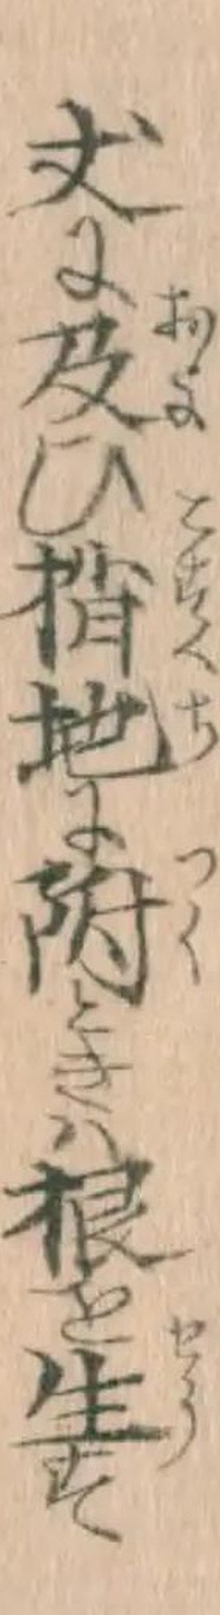丈に及ひ梢地に附ときは根を生す
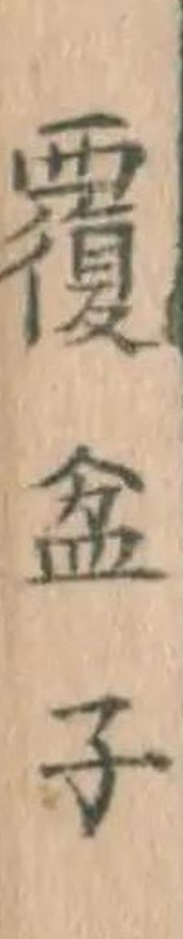覆盆子

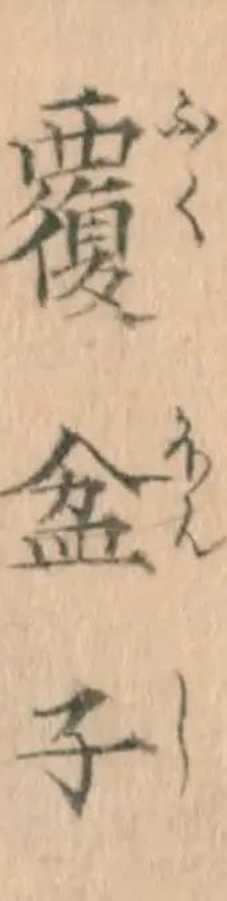覆盆子

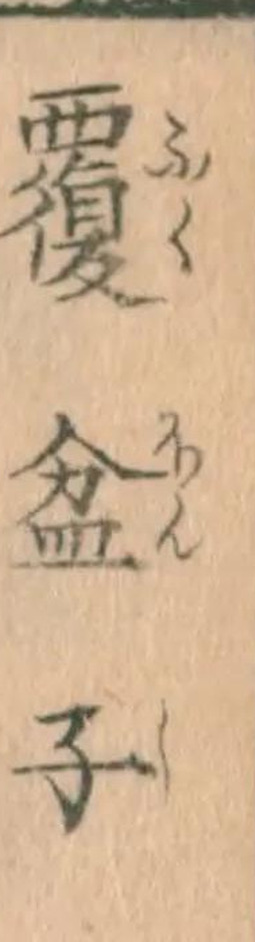覆盆子
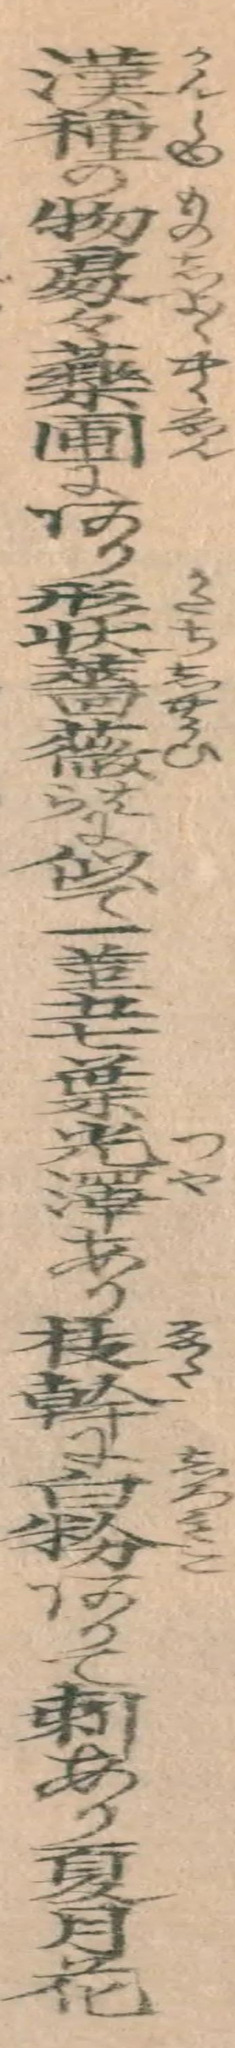漢種の物処々薬圃にあり形状薔薇はらに似て一茎五七葉光沢あり枝幹に白粉ありて剌あり夏月花
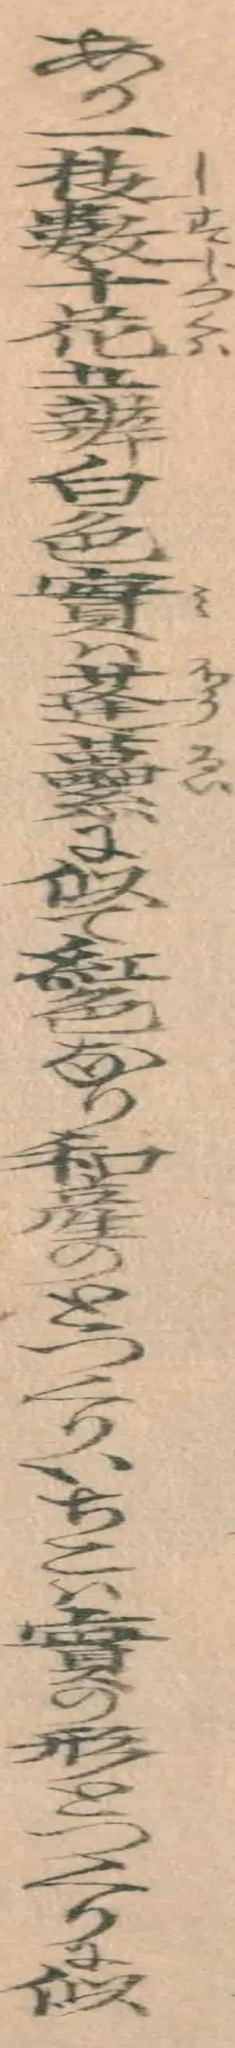あり一枝数十花五弁白色実は蓬虆に似て紅色なり和産のとつくりいちこは実の形とつくりに似
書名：本草図譜. 巻25-27
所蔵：国立国会図書館 National Diet Library, JAPAN
